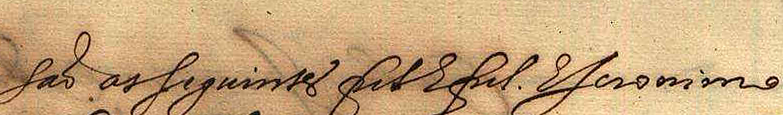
Saõ as seguintes ful E ful. E Jeronimo
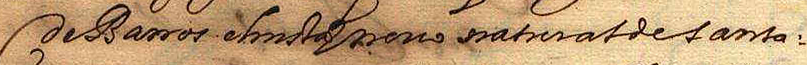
de Barros christaõ nouo natural de Santa
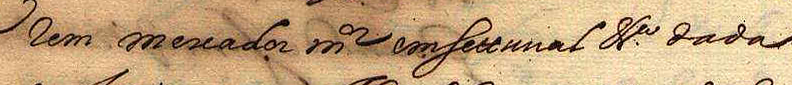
rem mercador mor em Settuual &a dada
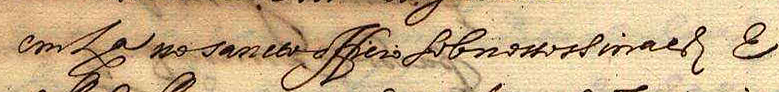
em Lxa no sancto officio sob nossos sinaes E
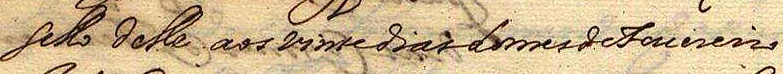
Sello delle aos vinte dias do mes de Feuereiro
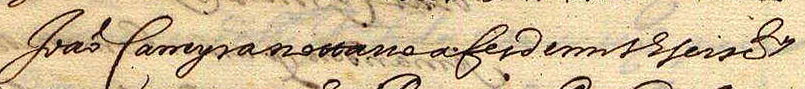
Joaõ Carreyra nottario a fes de mil E seisctos
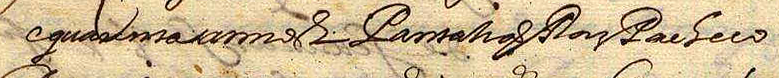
e quarenta annos E Pantaliaõ Roiz Pacheco
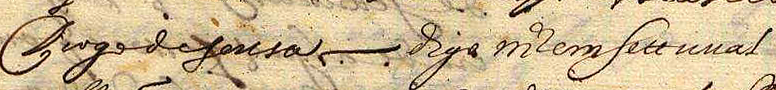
Diogo de Sousa - digo mor em Settuual
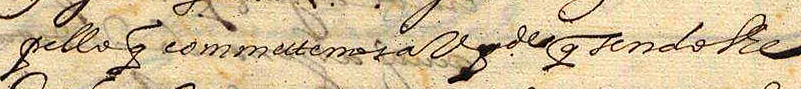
pello q̄ commettemos a V g.de q̄ sendo lhe
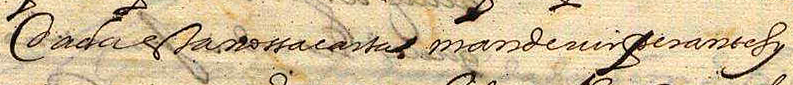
dada esta nossa carta mande uir perante Sy
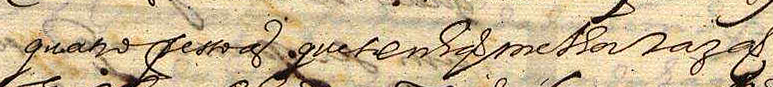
quatro pessoas que tenhaõ melhor razaõ
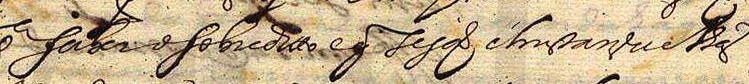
pa saber o sobreditto e q̄ sejaõ christans uelhos
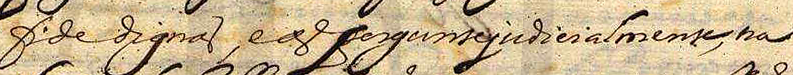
fidedignas, e se pergunte judicialmente, na
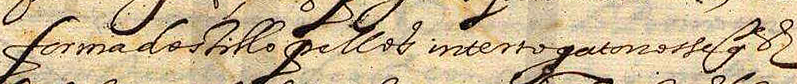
forma do stillo pellos interrogatorios seguintes
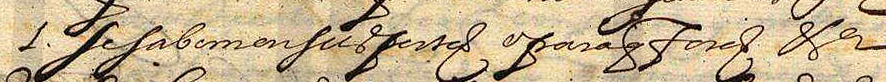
1. Se Sabem enSuspeitas e para q̄ forão &
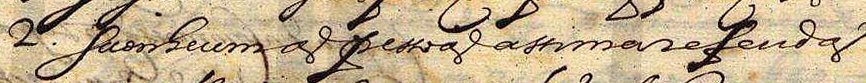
2. Se conhecem as pessoas assima referidas
